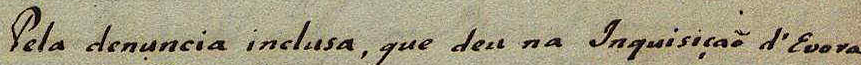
Pela denuncia inclusa, que deu na Inquisiçaõ d'Evora
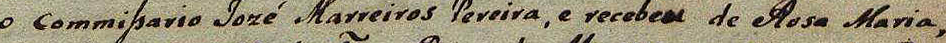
o Commissario Iozé Marreiros Pereira, e recebeu de Rosa Maria,
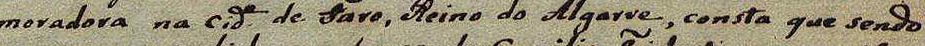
moradora na cid.e de Faro, Reino do Algarve, consta que sendo
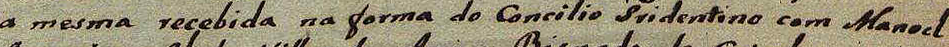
a mesma recebida na forma do Concilio Tridentino com Manoel
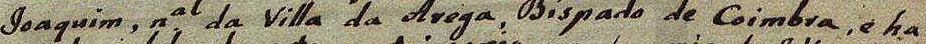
Ioaquim, n.al da Villa da Arega, Bispado de Coimbra, e ha
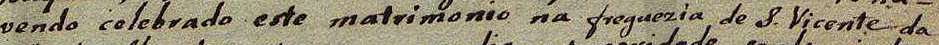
vendo celebrado este matrimonio na freguezia de S. Vicente da
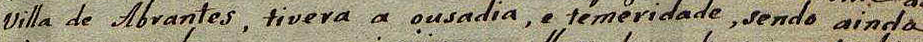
Villa de Abrantes, tivera a ousadia, e temeridade, sendo ainda
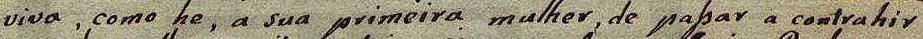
viva, como he, a sua primeira mulher, de passar a contrahir
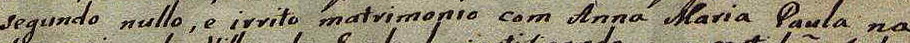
segundo nullo, e irrito matrimonio com Anna Maria Paula na
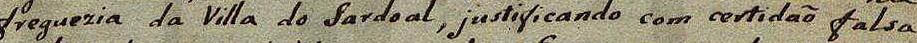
freguezia da Villa do Sardoal, justificando com certidaõ falsa
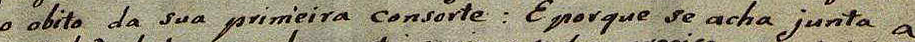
o obito da sua primeira consorte : E porque se acha junta a
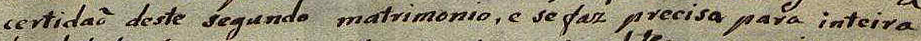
certidaõ deste segundo matrimonio, e se faz precisa para inteira
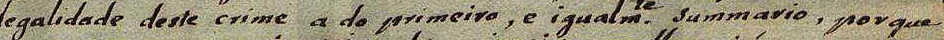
legalidade deste crime a do primeiro, e igualm.te summario, porque
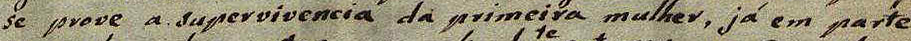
se prove a supervivencia da primeira mulher, já em parte
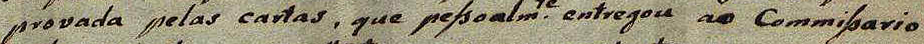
provada pelas cartas, que pessoalm.te entregou no Commissario
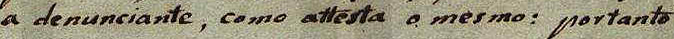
a denunciante, como attesta o mesmo: portanto
